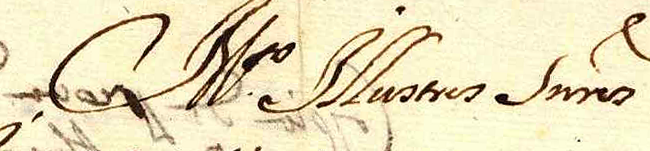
M.to Illustres Snres̄
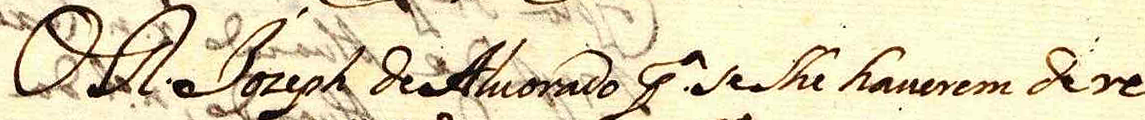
O R. Iozeph de Aluorado p.a se lhe hauerem de re
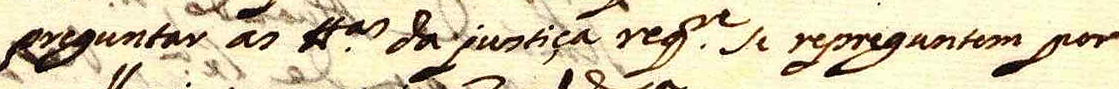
preguntar as tt.as da justiça req.re se repreguntem por
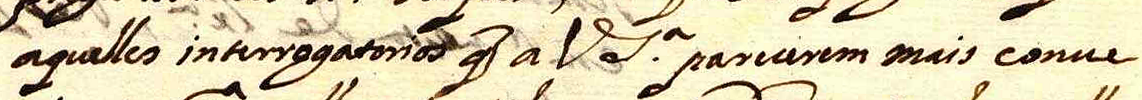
aquelles interrogatorios q̄ a V S.a parecerem mais conue
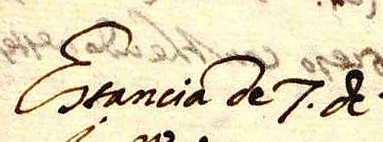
Estancia de 7. de
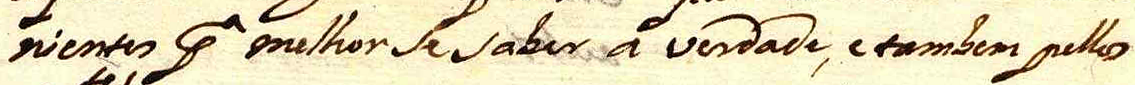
nientes pa melhor se saber a verdade, e tambem pellos
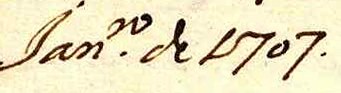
Ian.ro de 1707.
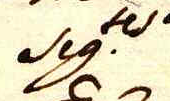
seg.tes
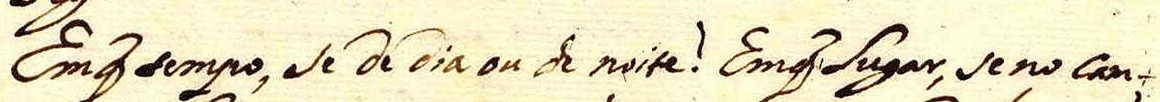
Em q̄ tempo, se de dia ou de noite? Em q̄ Lugar, se no cam
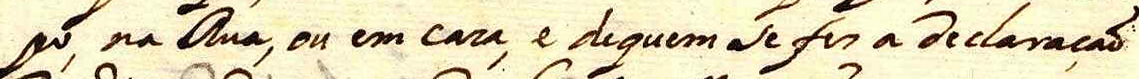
po, na Rua, ou em caza, e de quem se fez a declaraçaõ
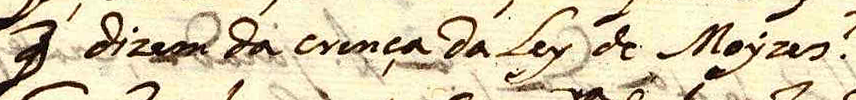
q̄ dizem da crença da Ley de Moyzes?
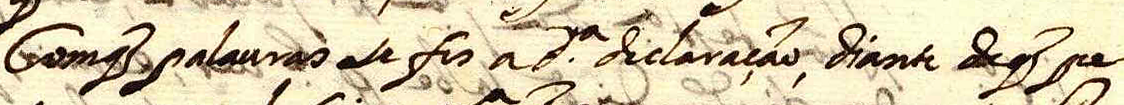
Com q̄ palauras se fes a d.a declaração, diante de q̄ pe
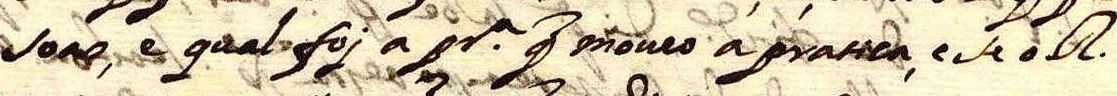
soas, e qual foj a pr.a q̄ moueo a pratica, e se o R.
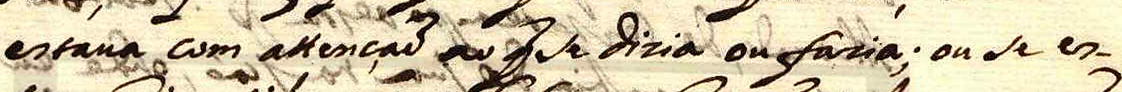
estaua com attençaõ ao q̄ se dizia ou fazia; ou se es
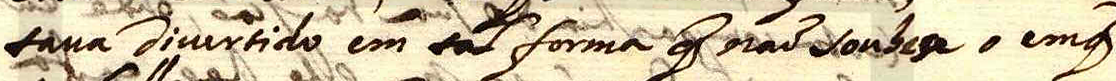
taua diuertido em tal forma q̄ naõ soubese o em q̄
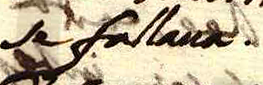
se fallaua.
